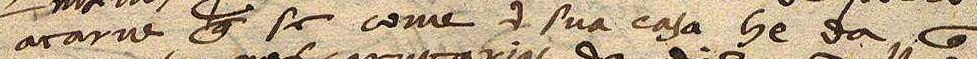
a carne q̄ se come ē sua casa he da q̄
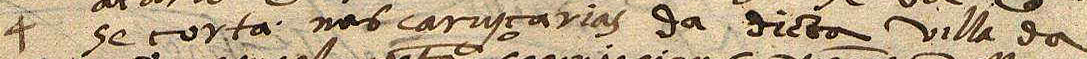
4 se corta. nas carnjçarias da dicta villa da
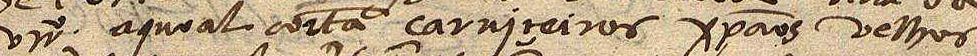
vrro. a quoal cortā carniceiros xpãos velhos
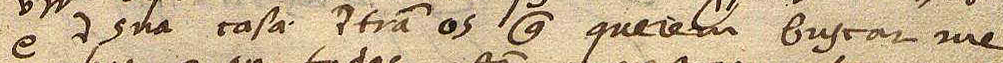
e ē sua casa. ētrā os q̄ querem buscar me
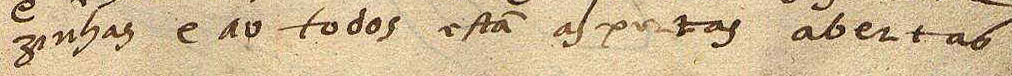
zinhas e ao todos estā as portas abertas
